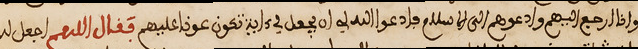وانا ارجع اليهم وادعوهم الى الاسلام فادعوا الله لى ان يجعل لى ءاية تكون عونا عليهم فقال اللهم اجعل له
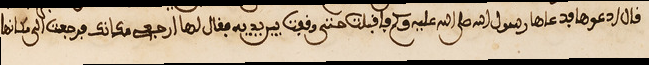قال ادعوها فدعاها رسول الله صلى الله عليه وسلم فاقبلت حتى وقفت بين يديه فقال لها ارجعى مكانك فرجعت الى مكانها
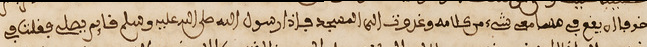خوفا ان لا يقع في مسامعه شىء من كلامه و غدوت الى المسجد فاذا رسول الله صلى الله عليه و سلم قائم يصلى فقلت في
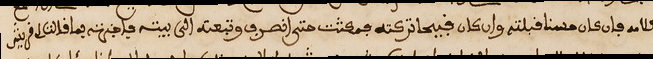كلامه فان كان حسنا قبلته وان كان قبيحا تركته فمكثت حتى انصرف وتبعته الى بيته فاخبرته بما قالت لى قريش
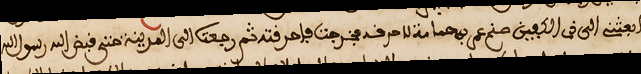ابعثنى الى ذى الكفين صنم عمر بن حمامة لاحرقه فخرجت فاحرقته ثم رجعت الى المدينة حتى قبض الله رسول الله
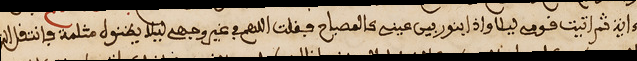ئاية ثم اتيت قومه ليلا واذا بنور بين عينى كالمصباح فقلت اللهم في غير وجهى ليلا يظنوه مثلمة فانتقل النور
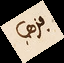فذهب
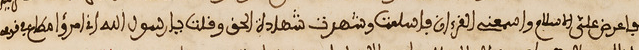فاعرض على الاسلام واسمعنى القرءان فاسلمت وشهدت شهادة الحق وقلت يا رسول الله انى امرؤا مطاع في قومى
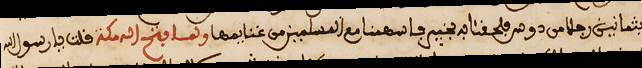بثمانين رجلا من دوس فلحقنا به بخبير فاسهمنا مع المسلمين من غنايمها ولما فتح اله مكة قلت يا رسول الله
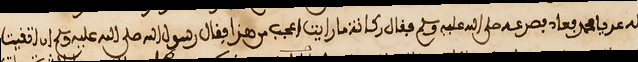له عديا محمد فعاد فصرعه صلى الله عليه وسلم فقال ركانة ما رايت اعجب من هذا فقال رسول الله صلى الله عليه وسلم ان اتقيت
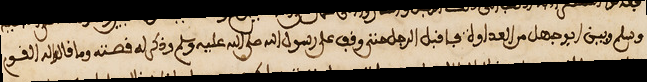وسلم وبين ابو جهل من العداوة فاقبل الرجل حتى وقف على رسول الله صلى الله عليه وسلم وذكر له قصته وما قالوا له القوم
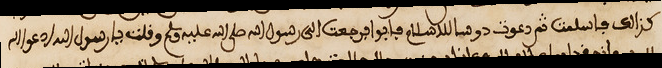كذلك فاسلمت ثم دعوت دوسا للاسلام فابوا فرجعت الى رسول الله صلى الله عليه وسلم وقلت يا رسول الله ادعوا الله
